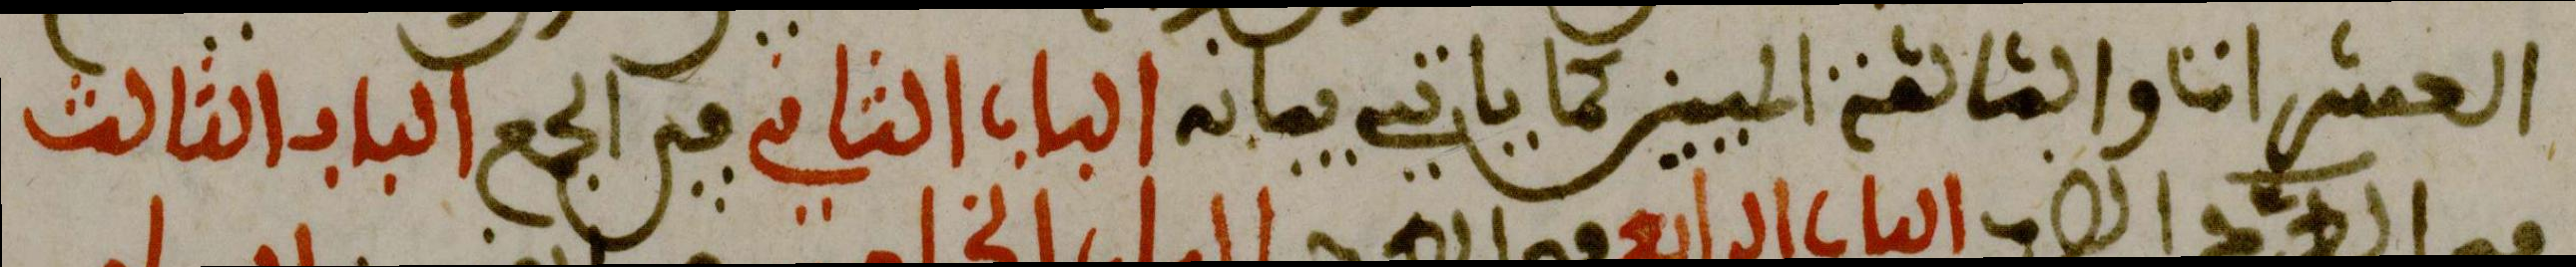العشرات والثالثة الميين كما ياتي بيانه الباب الثاني في الجمع الباب الثالث
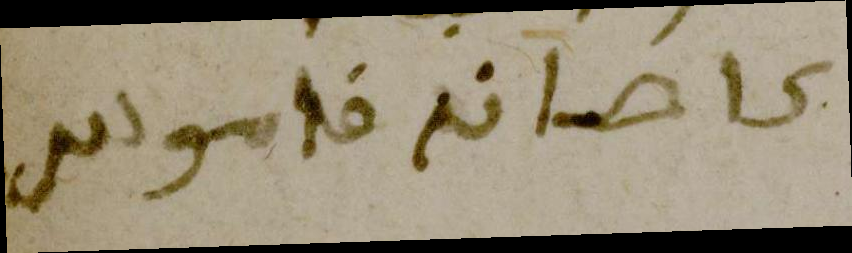كاصانه فا و الى
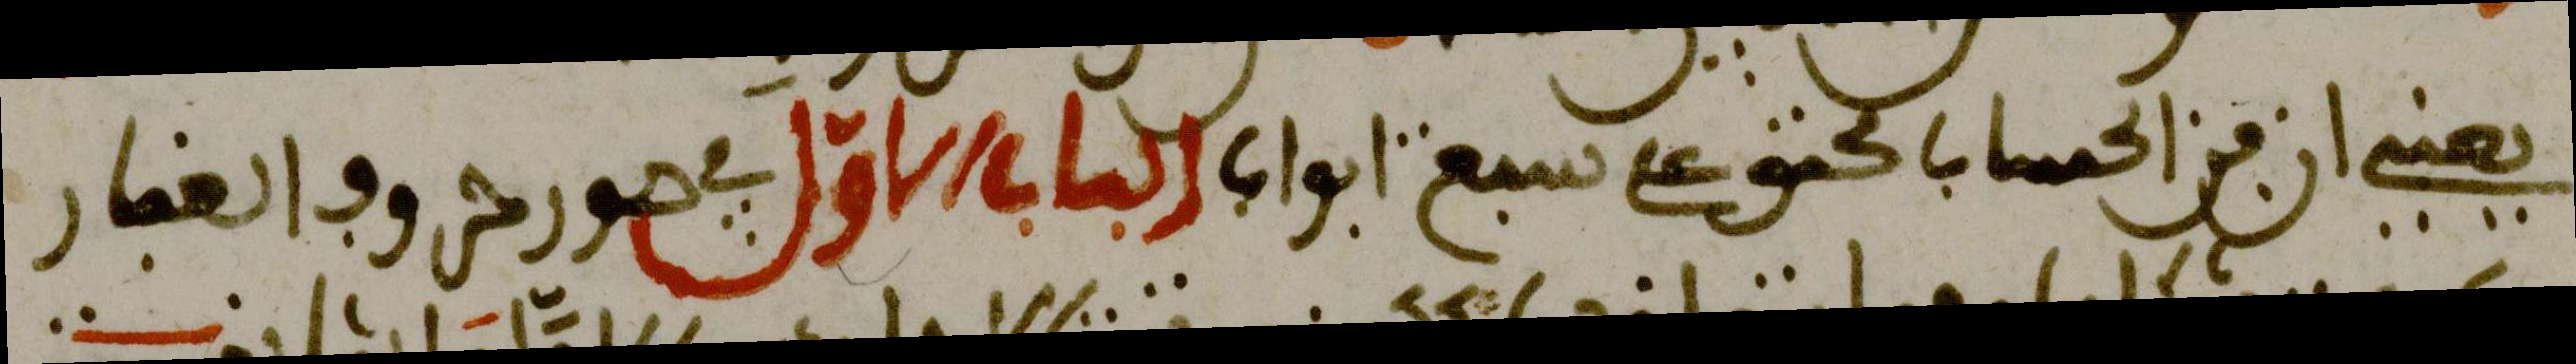يعني ان من الحساب محتو على سبع ابواب الباب الاول في صور حروف الغبار
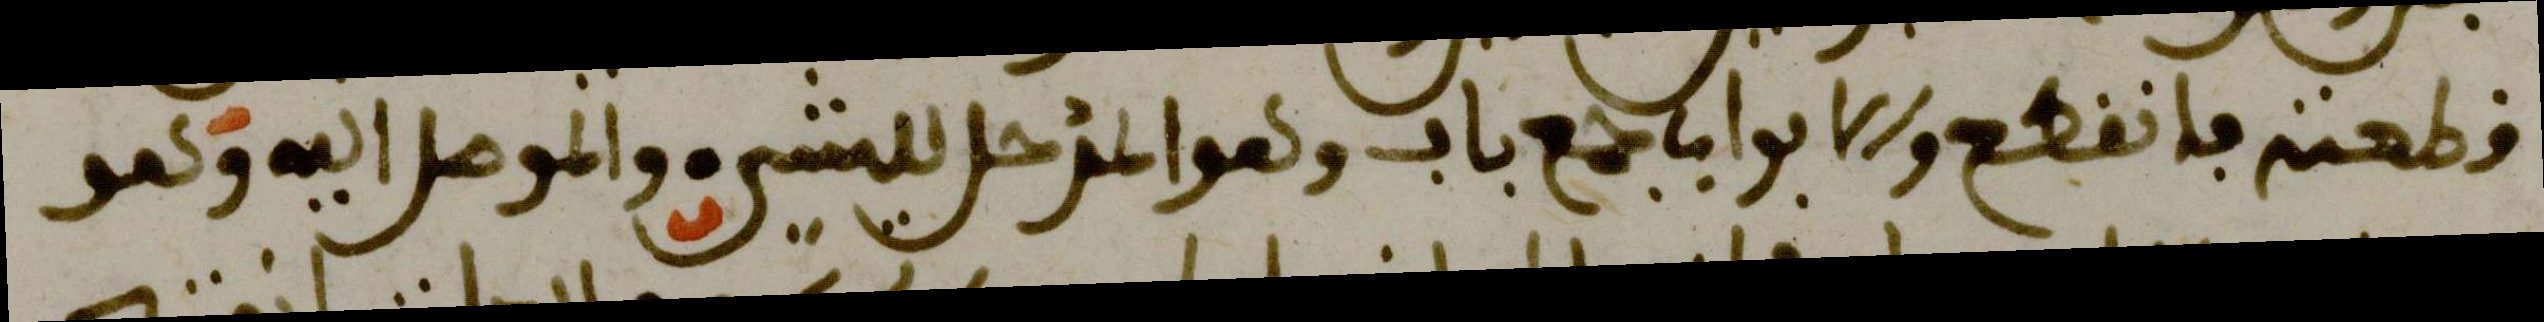قطعته فانقطع والابواب جمع باب وهو المدحل للشيئ والموصل اليه وَهو
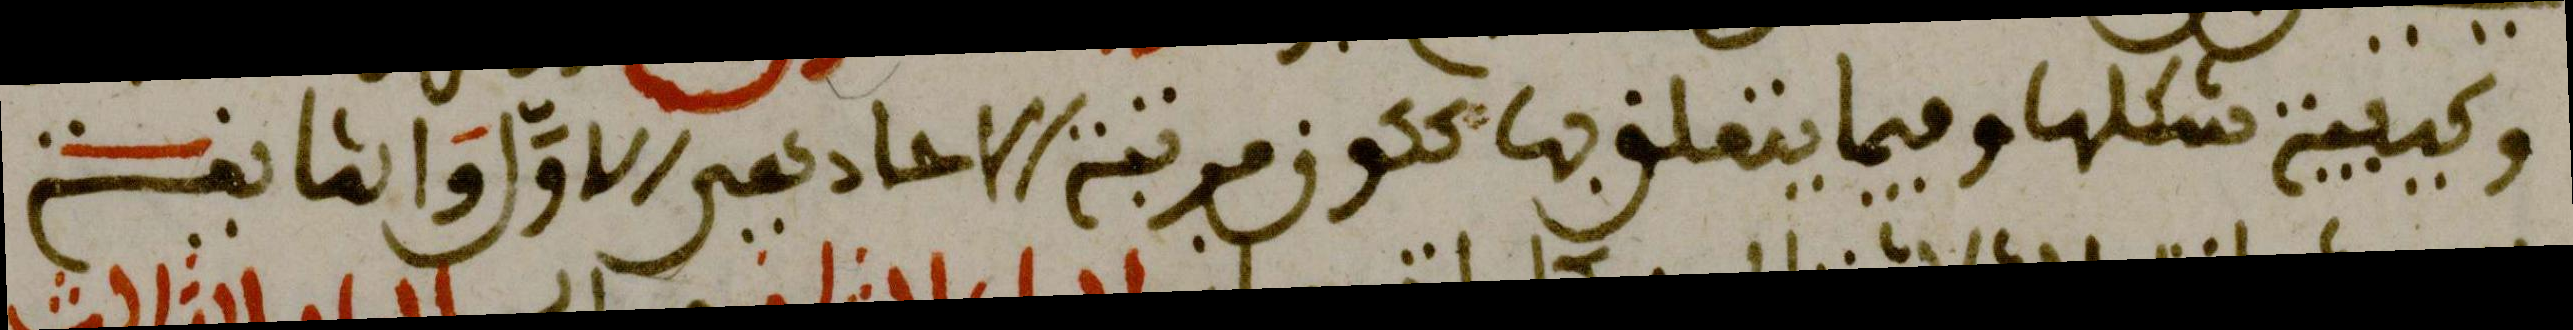وكيفية شكلها وفيما يتعلق بها ككون مرتبة الاحاد هي الاوّل والثانية
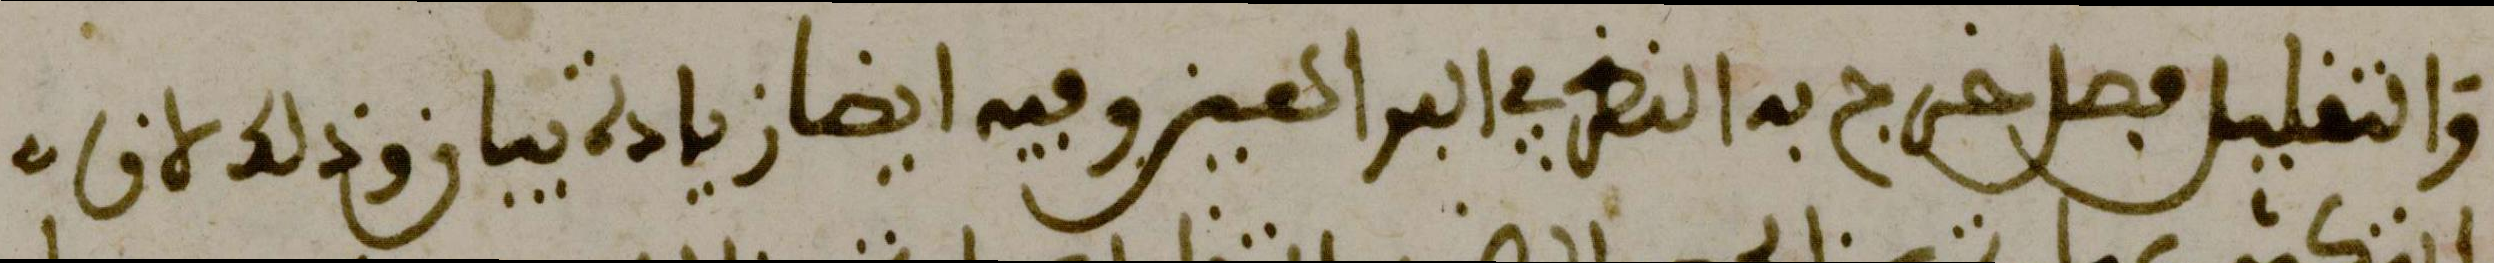والتقليل فصل خرج به النظر في البراهين وفيه ايضا زيادة بيان وذلك لان
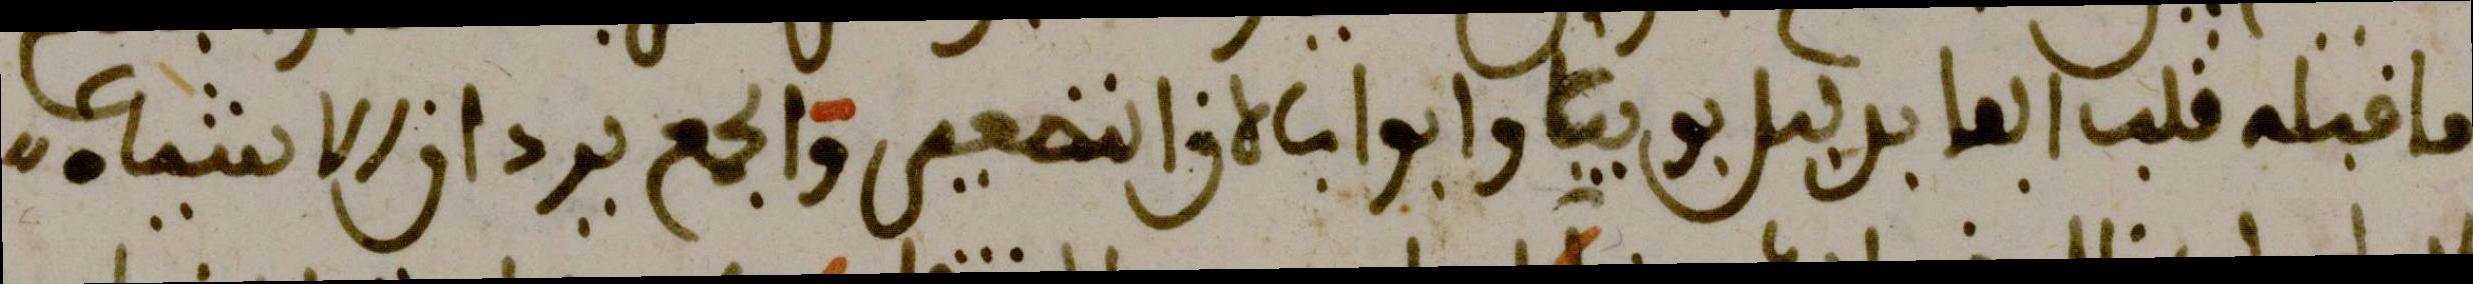ما قبله قلب الفا بد ليل بويب وابواب لان التصعين وَالجمع يرد ان الاشياء
